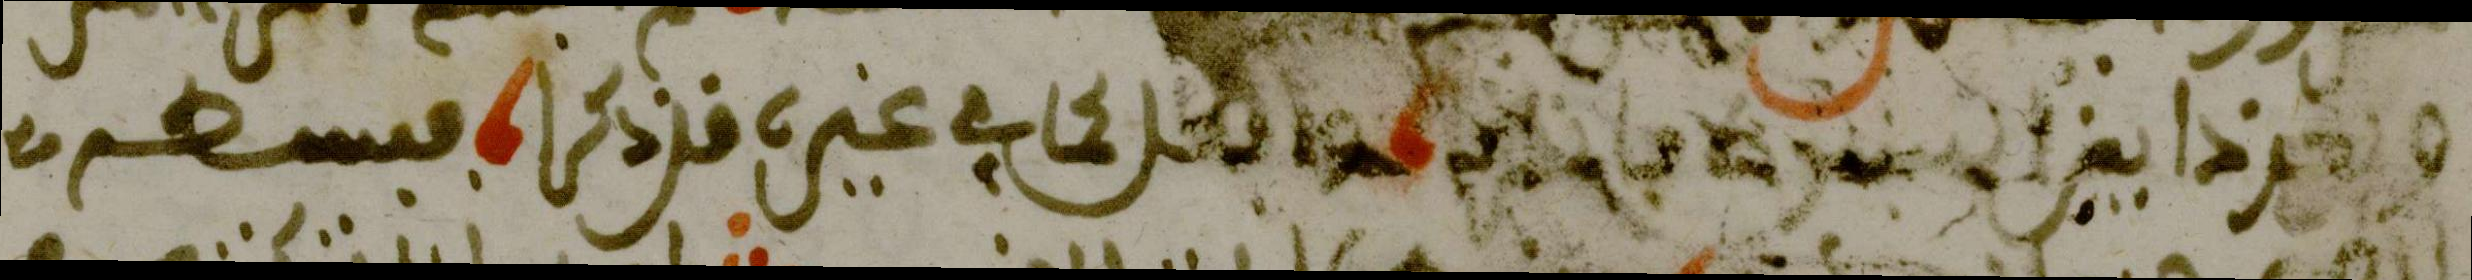وبعد ذابين البسوط فانظرا وافعل كما في غيره قد ذكرا فبسطه
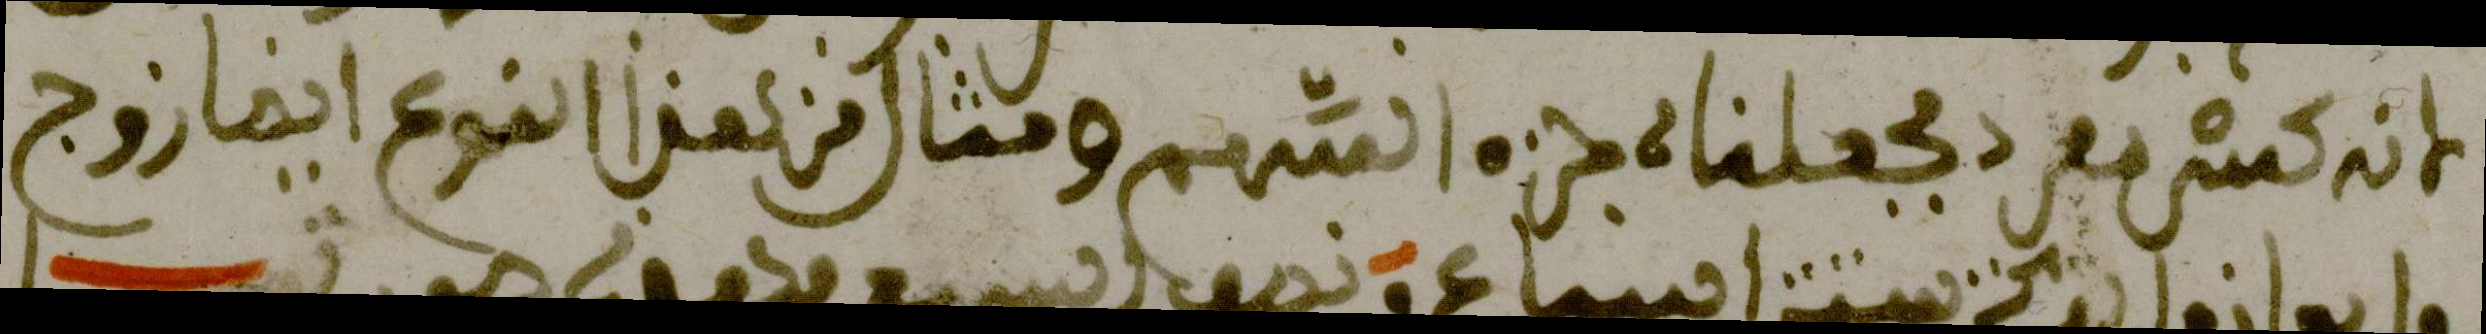لانه كسْر مفرد فجعلناه جزء السَّهم ومثال من هذا النوع ايضا زوج
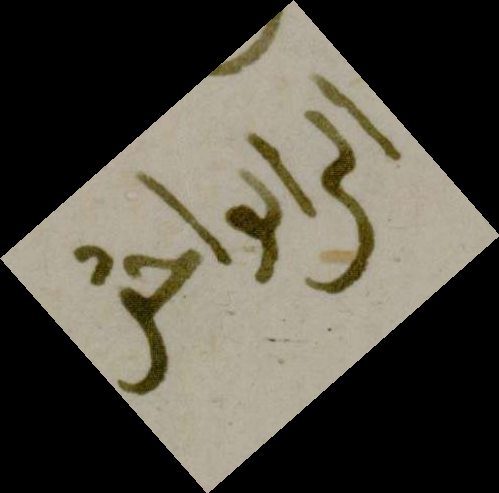الى الواحد
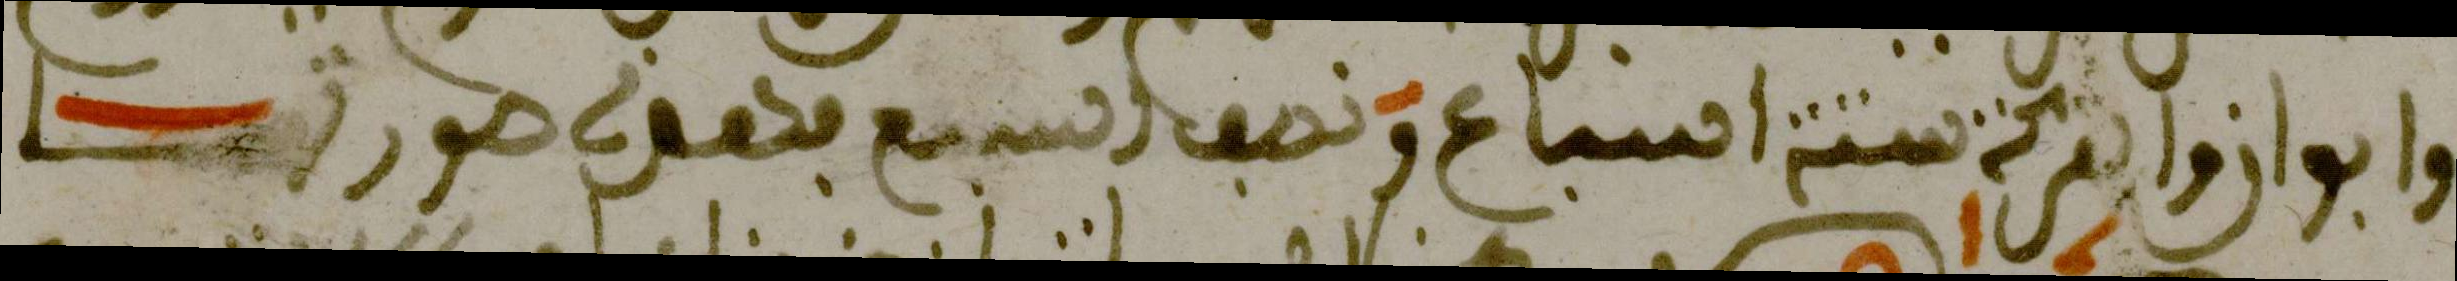وابوان والتركة ستة اسباع وَنصف السبع فهذه صورتهَا
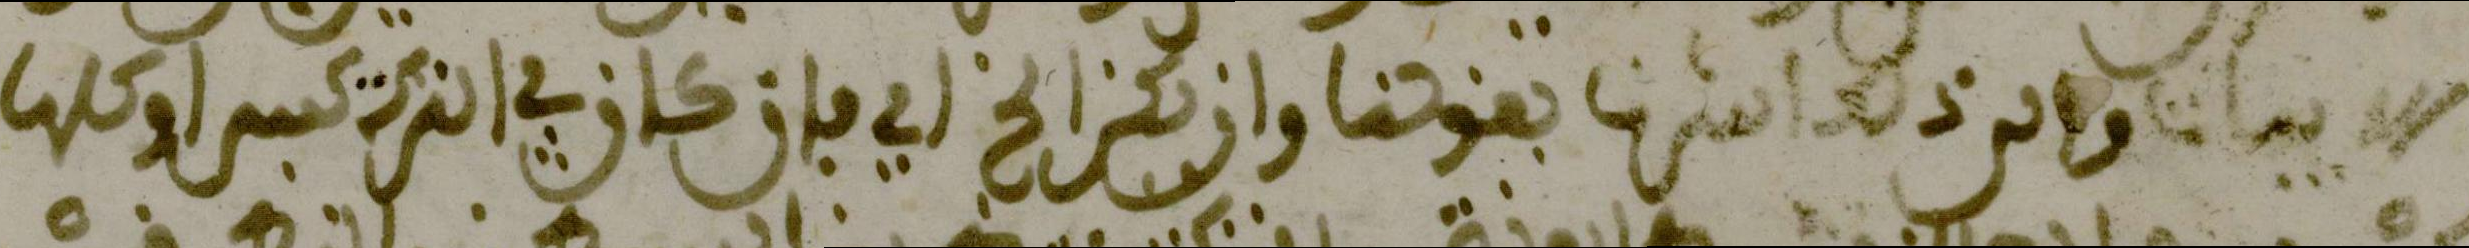الابيات والى ذلك اشرن بقولنا وان يكن الخ اي فان كان في التركة كسرا وكلها
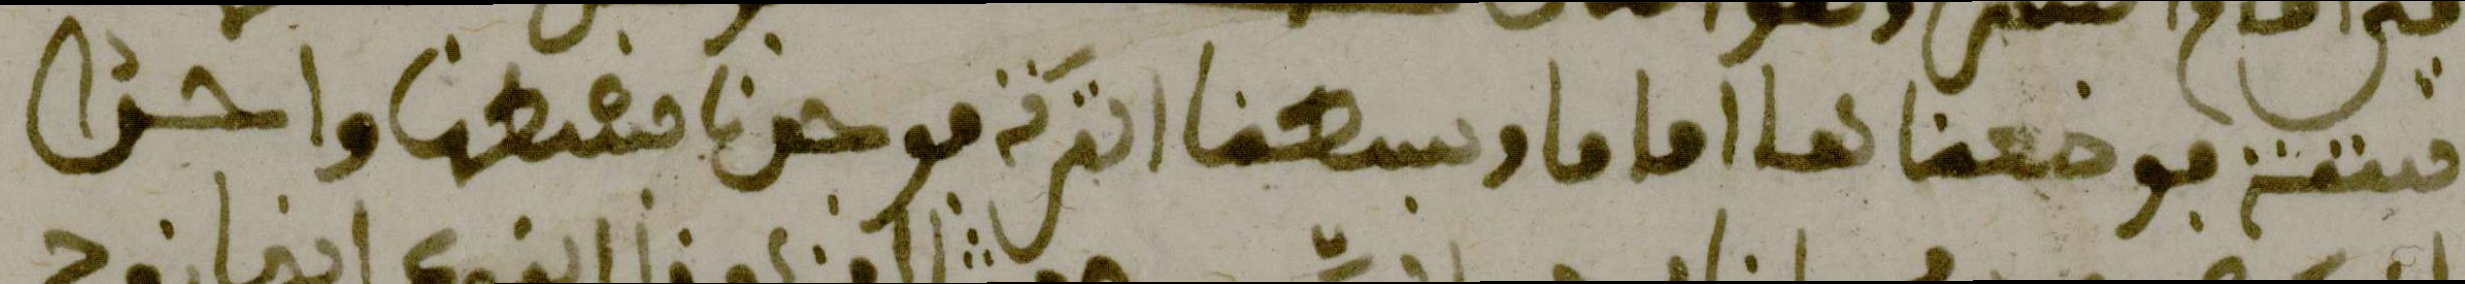سته فوضعناها اماما وبسطنا التركة فوجدنا بسْطها واجد
